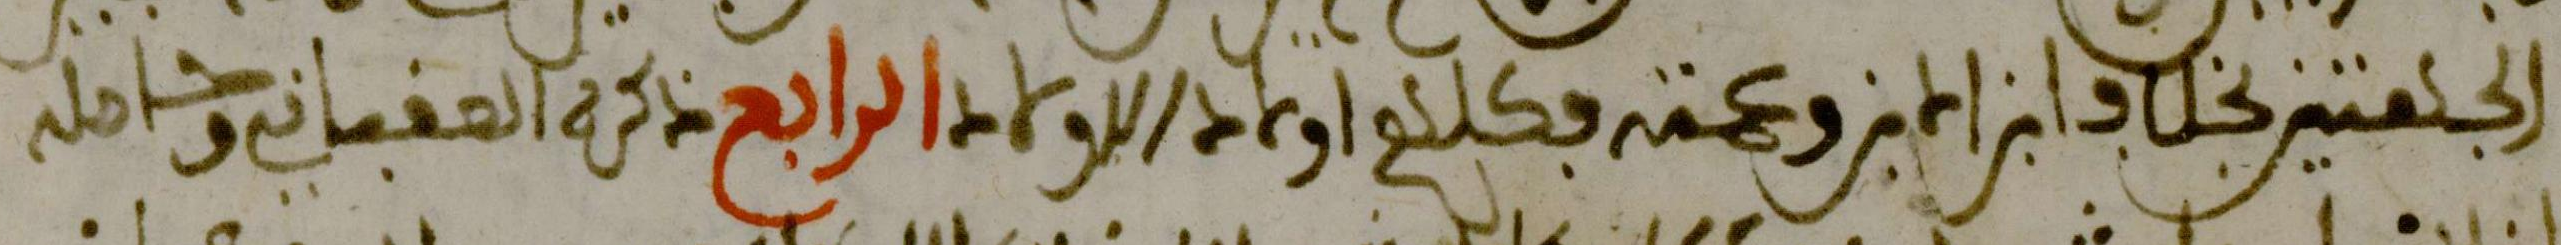الجهتين بخلاف ابن الابن وعمته فكلهم اولاد الاولاد الرابع ذكره العقباني وحاصله
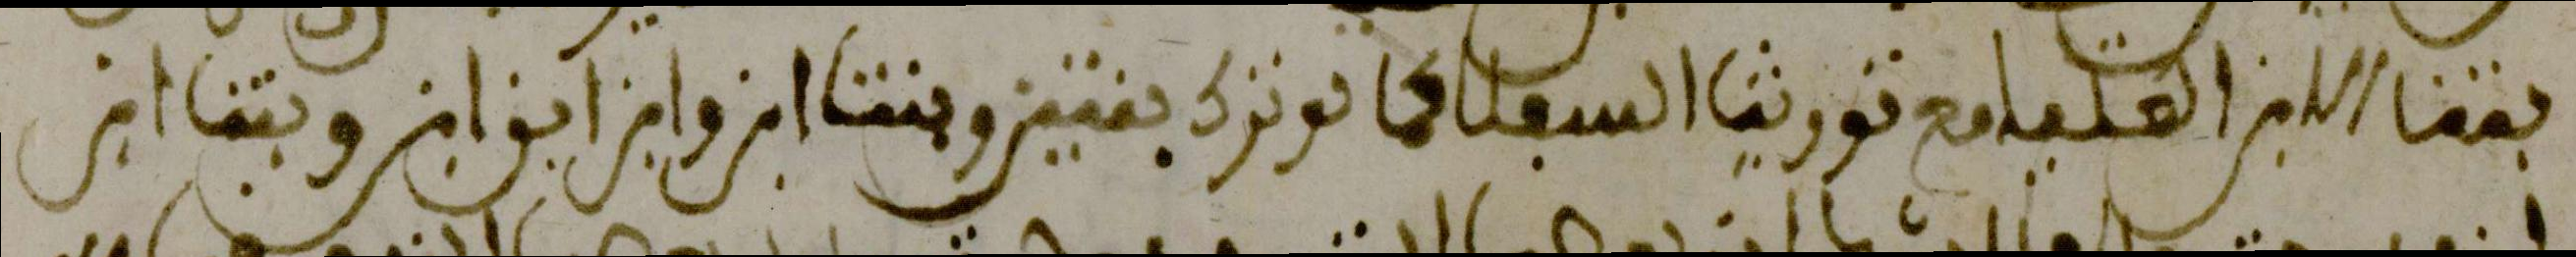بنت الابن العليا مع توريث السفلا كما لوترك بنتين وبنت ابن وابن ابن ابن وبنت ابن
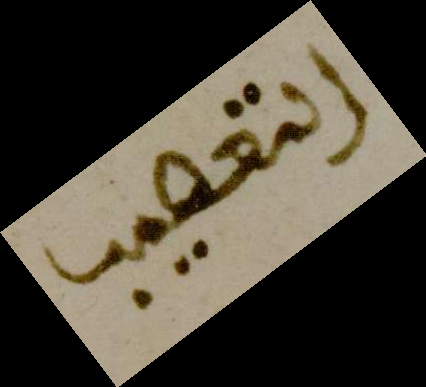التعصيب
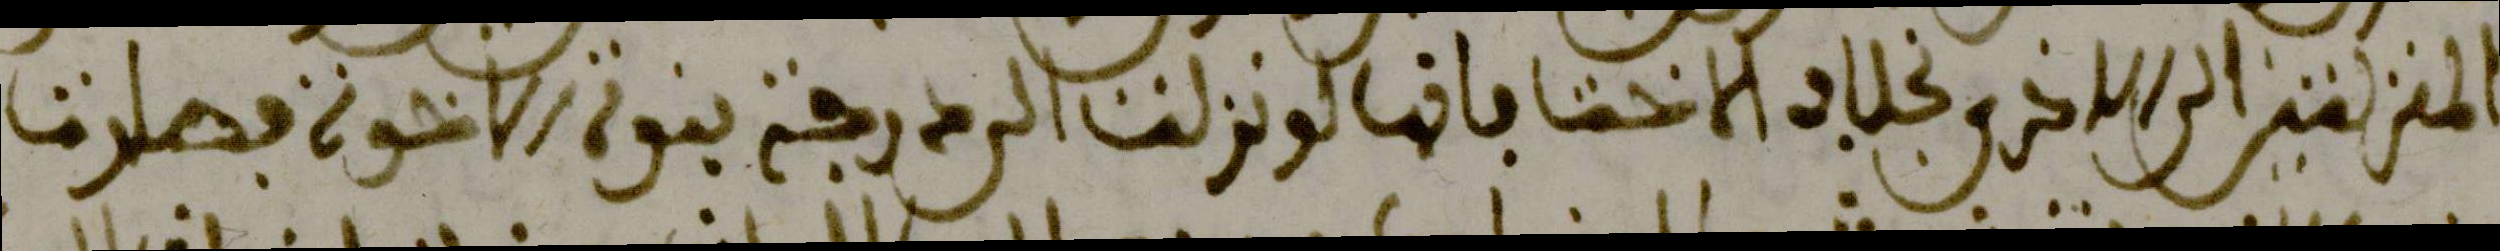المنزلتين الى الاخرى بخلاف الاخت فانها لو نزلت الى درجة بنوة الاخوة فصارت
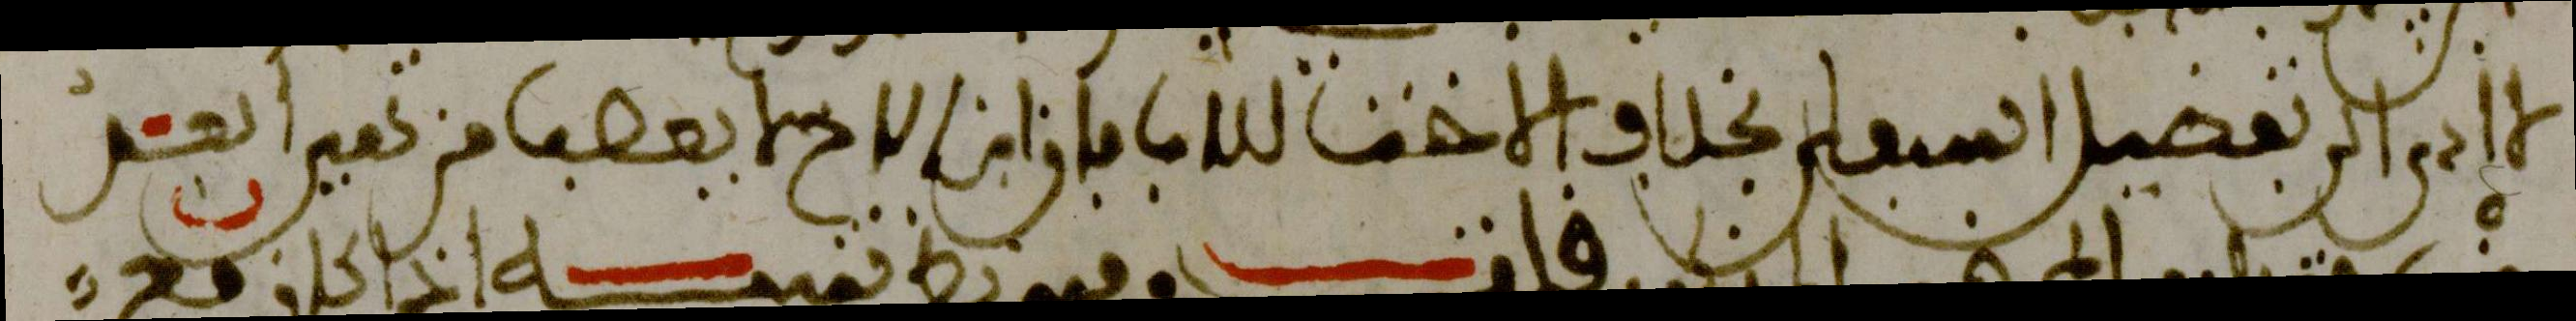لا ادى الى تفضيل السفلى بخلاف الاخت للاب فان ابن الاخ لا يعصب من هي ابعد
